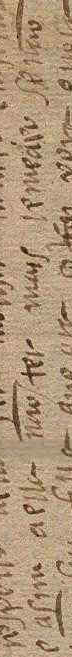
e asim a ella não ter mais remedeo senão
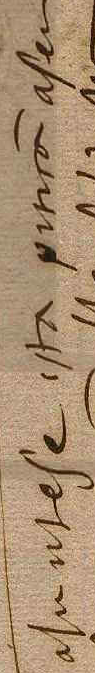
aJuntese esta pitiçā a seu
